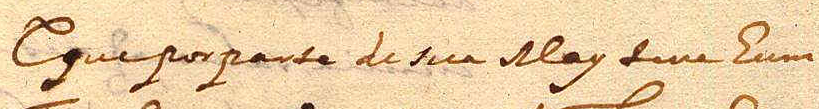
E que por parte de sua May teue hum
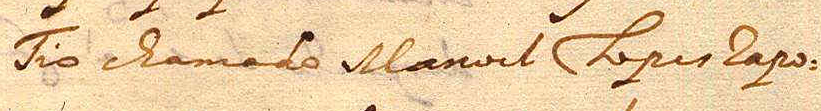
Tio chamado Manoel Lopes Rapo
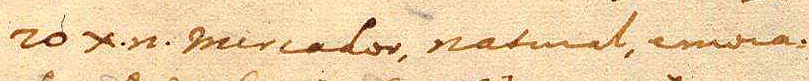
zo x. n. mercador, natural, e mora
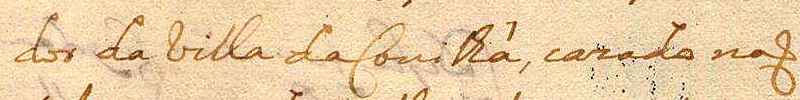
dor da Villa da Couilhã, cazado naõ
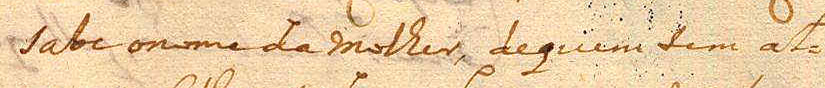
sabe o nome da molher, de quem tem al
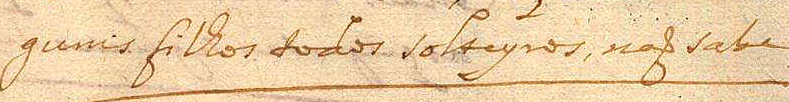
gums filhos todos solteyros, naõ sabe
